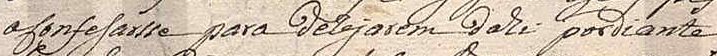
a confesarsse para dezejarem dahi por diante
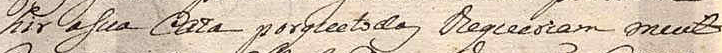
hir a sua caza porque todas lhe queriam muito
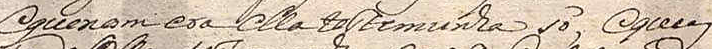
e que nam era ella testemunha só, E que es
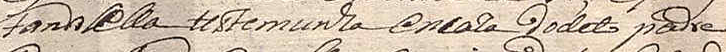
tando ella testemunha en caza do dito padre
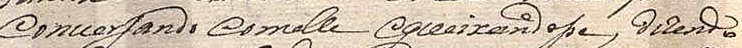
conuersando com elle e queixandosse, dizendo
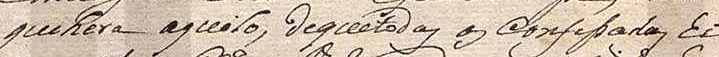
que hera aquilo, de que todas as confessadas hi
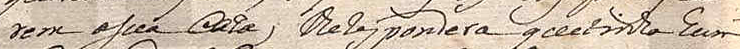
rem a sua caza, lhe respondera que tinha hum
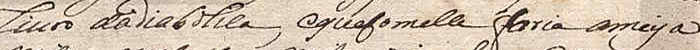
Liuro da diabolica, e que Com elle faria a meya
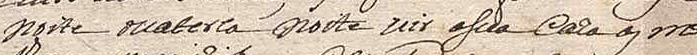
noite ou a terca noite uir a sua caza as mo
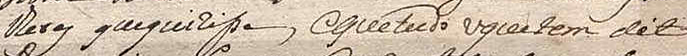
lheres que quizisse, e que tudo o que tem dito
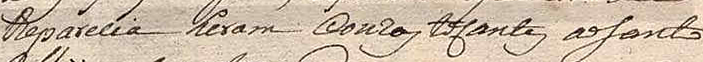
lhe parecia heram couzas toCantes ao santo
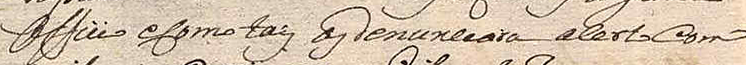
Officio e Como tais as denunciara a certo com
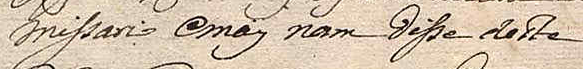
missario e mais nam disse deste
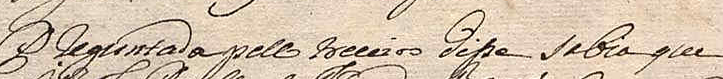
Preguntada pello treceiro disse sabia que
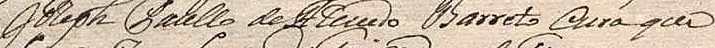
Jozeph Paullo de Azevedo Barreto cura que
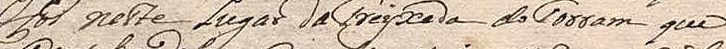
foi neste lugar da Freyxeda do Torram que
